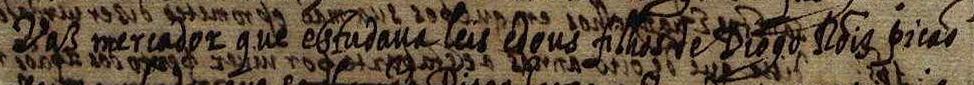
Vaz mercador que estudaua leis e dous filhos de Diogo Roīz picaõ
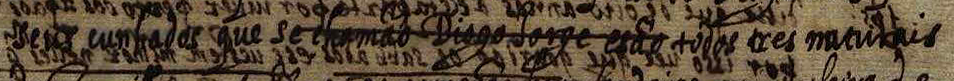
seus cunhados que se chamão Diogo Iorge e são todos tres naturais
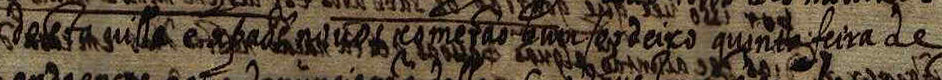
desta uilla e xpaõs nouo comerão hum Cordeiro quinta feira de
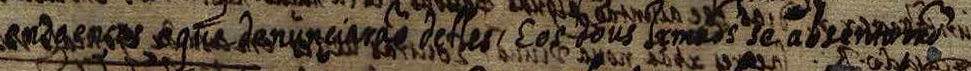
endoenças e que denunçiarão delles / E os dous Irmaõs se absentaraõ
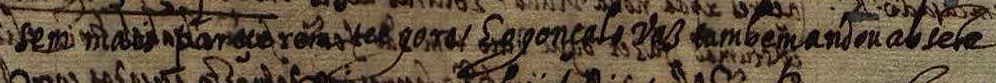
sem mais parecerem tee gora / E o gonçalo Vaz tambem andou absēte
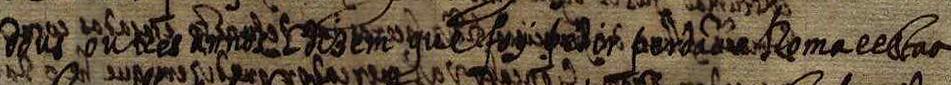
dous ou tres annos E dizem que foy pedir perdaõ a Roma e estaa
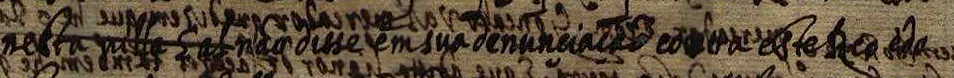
nesta uilla E al não disse em sua denunciaçaõ contra este Reo e do
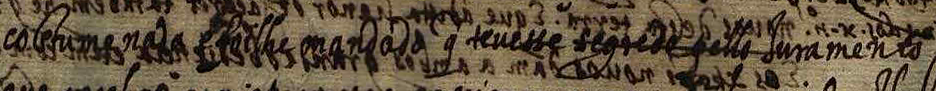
costume nada E foilhe mandado q̄ teuesse segredo pello Juramento
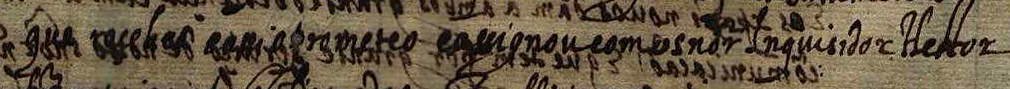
que recebeo e assi o prometeo e assignou com o snōr Inquisidor Hector
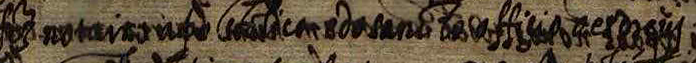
frz̄ notairo apostolico e do sancto officio o escreuj
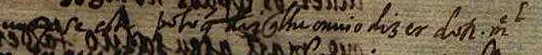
untase este polo q̄ diz q̄ lhe ouuio dizer d R. mel
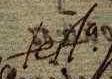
testa
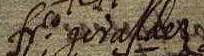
frco. giraldez
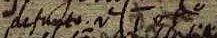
defunto. v̄ j̄ o to
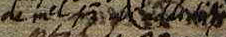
de mel frz̄ pelo dito
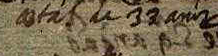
aetas de 33 anos
